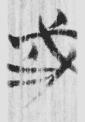武
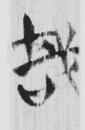哉
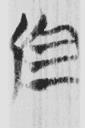於
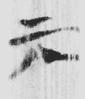亓
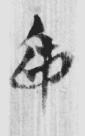身
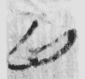㠯（以）
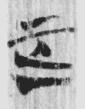正
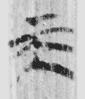天
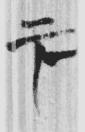下
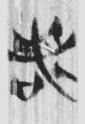若
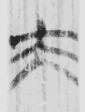夫
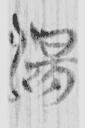湯
